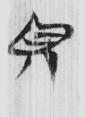{目人}
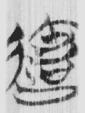達
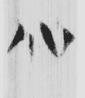化
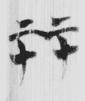幵
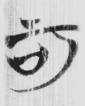可
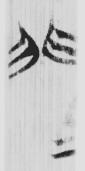非=
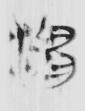渭
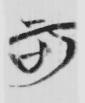可
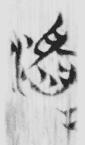滔=
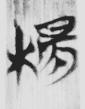楊
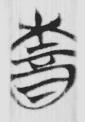{木酉}
